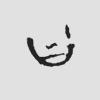曰
